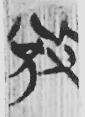敓（說）
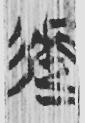逨（來）
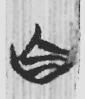自
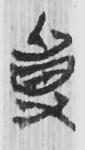尃
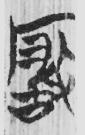{厂敢}
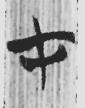才
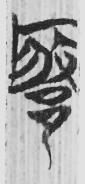{殷邑}（殷）
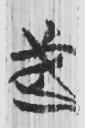武
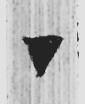丁
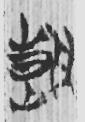朝
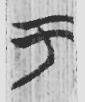于
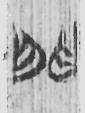門
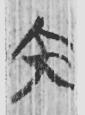內
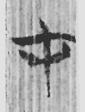才
